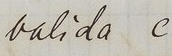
valida e
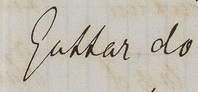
Gottardo.
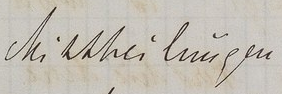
Mittheilungen
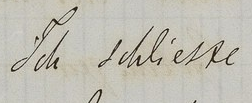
der Versicherung
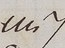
meiner
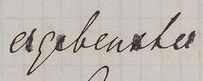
ergebenster
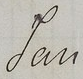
Bern
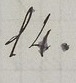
14.
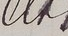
Jan. 1870.
